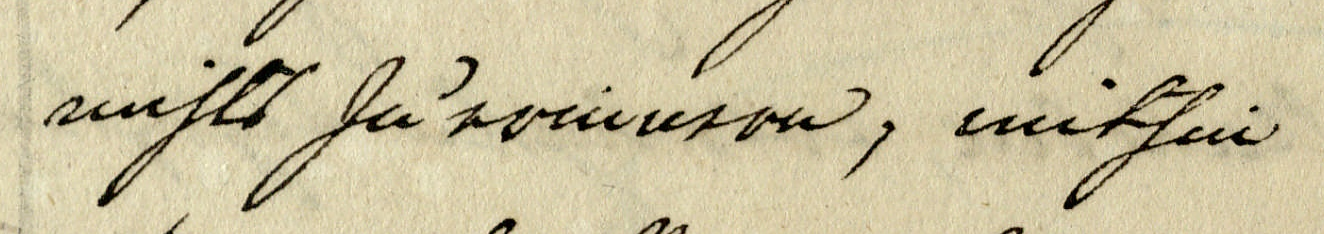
nichts zu erinnern, mithin
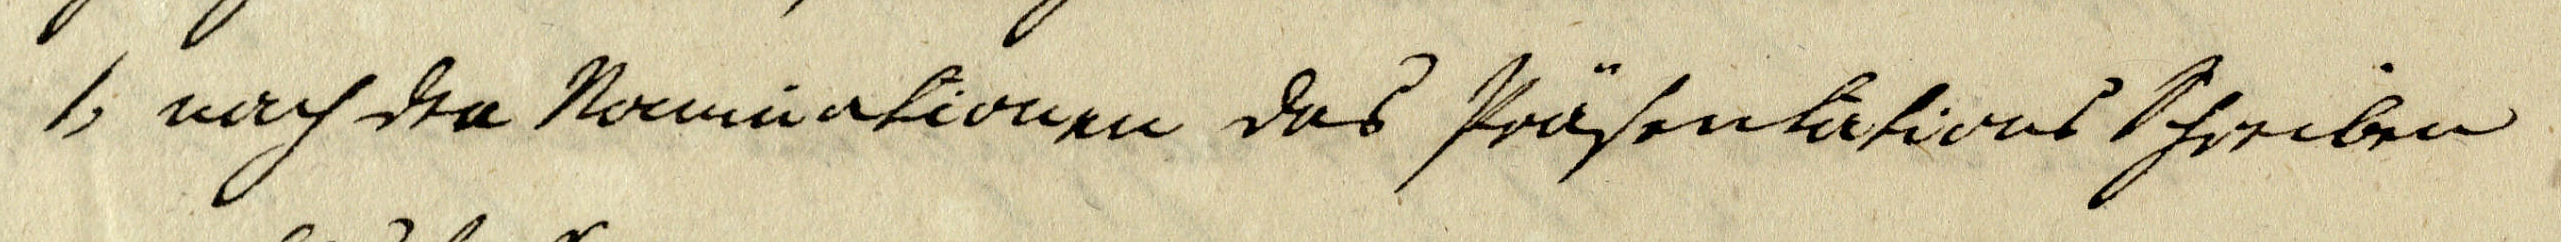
1. nach den Nominationen das Präsentations Schreiben
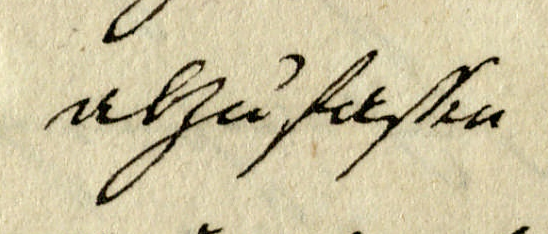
abzufassen
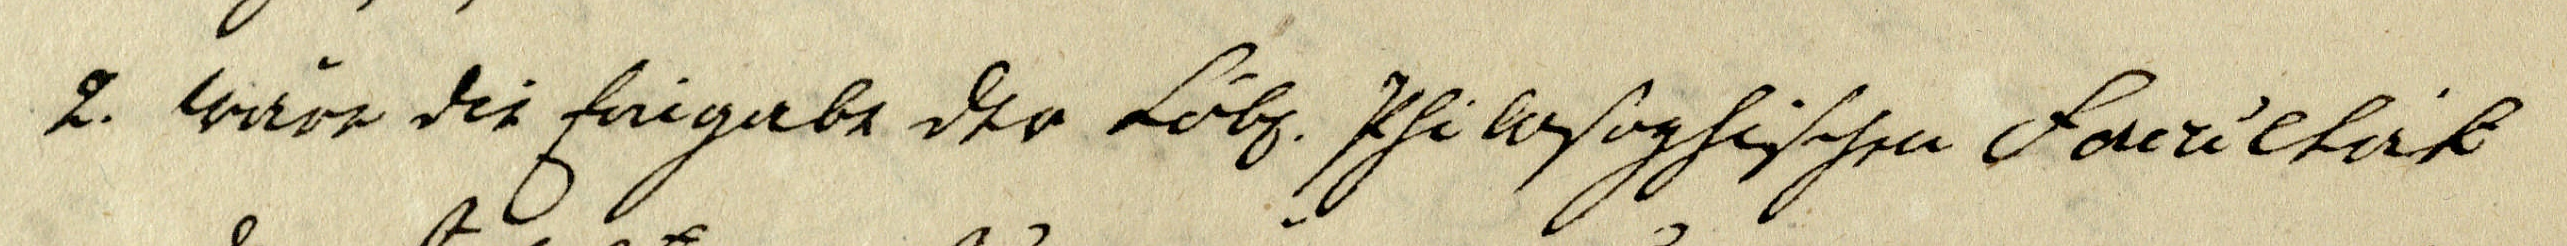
2. wäre die Eingabe der Löbl. Philosophischen Facultät
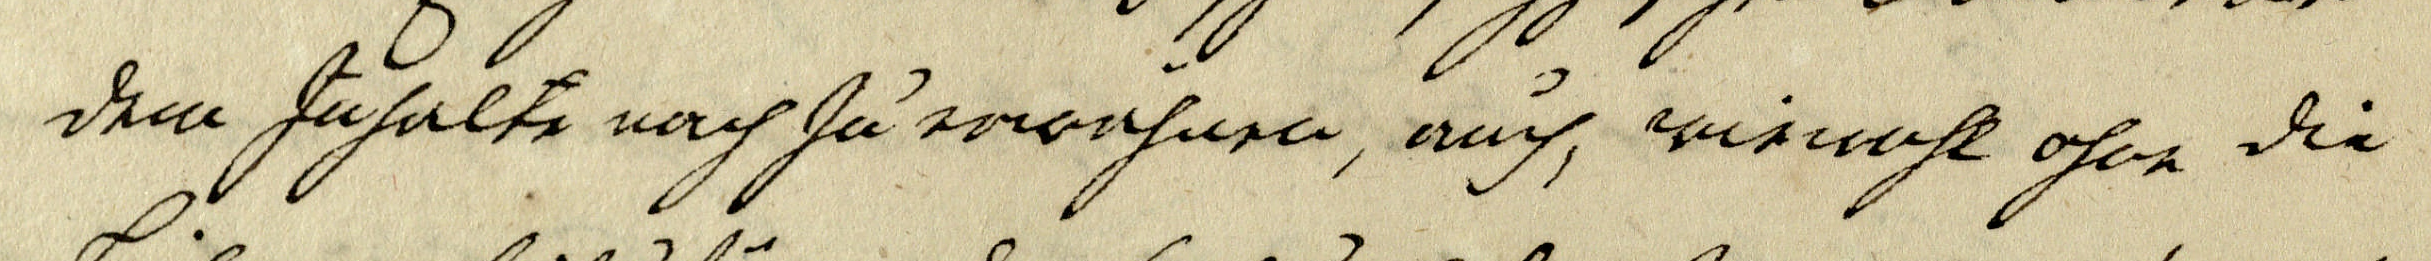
dem Inhalte nach zu erwähnen, auch, wiewohl ohne die
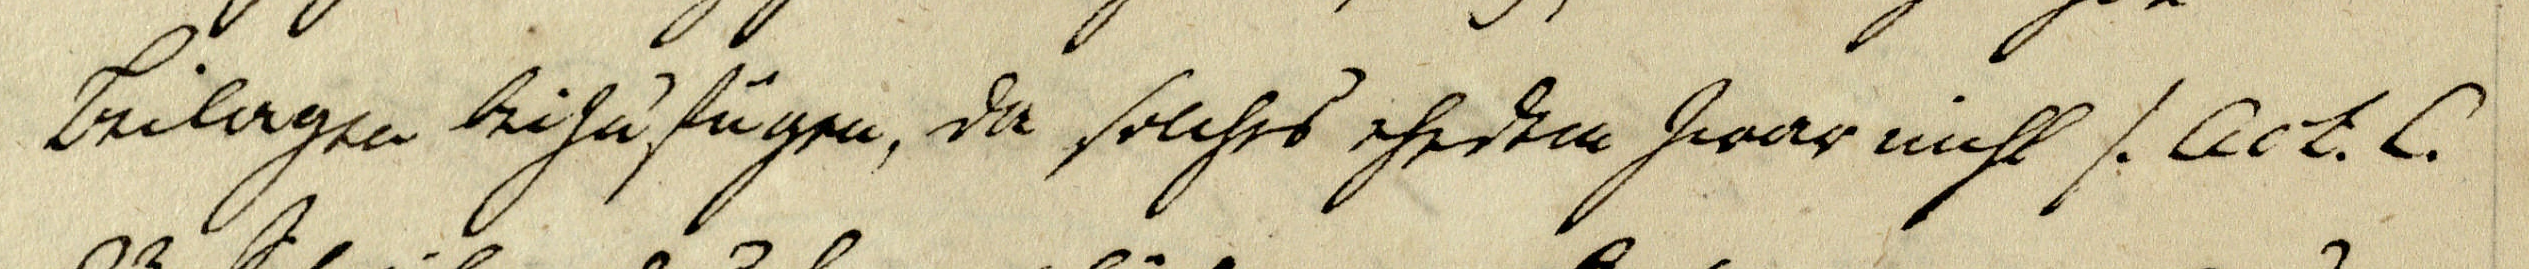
Beilagen beizufügen, da solches ehedem zwar nicht /. Act. L.
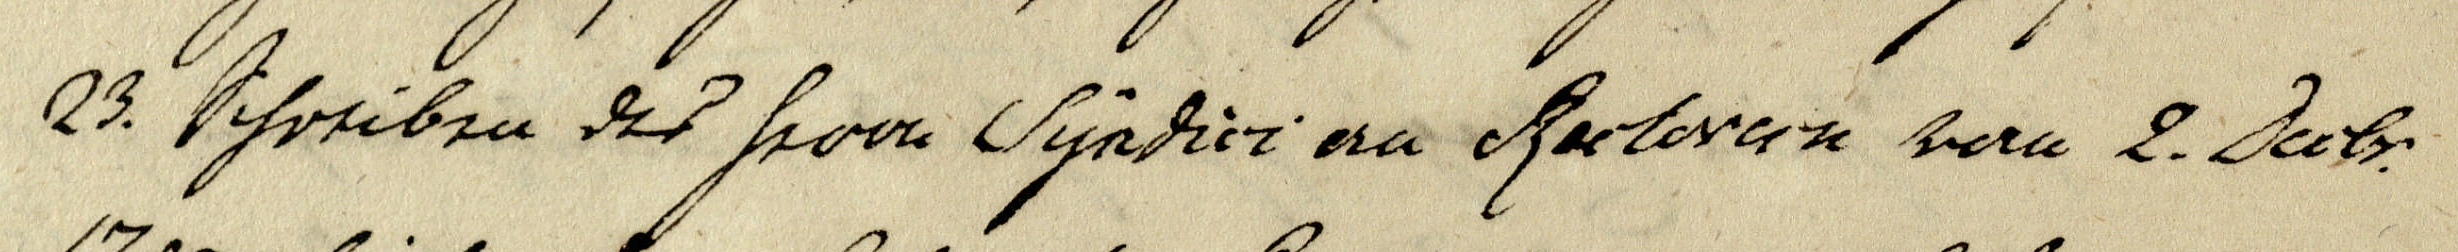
23. Schreiben des Herrn Sÿndici an Rectorem vom 2. Decbr.
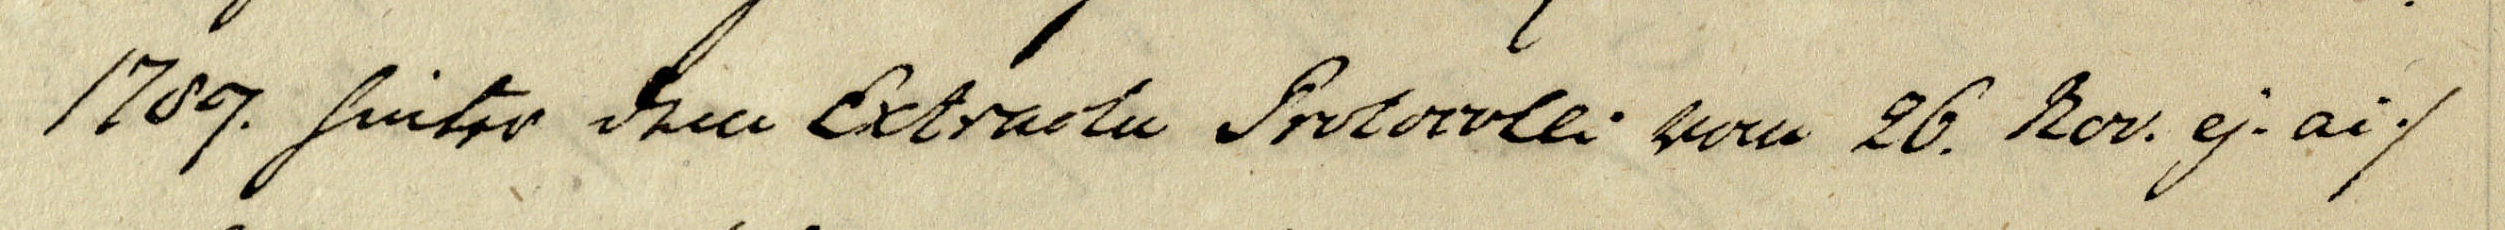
1787. hinter dem Extractu Protocolli vom 26. Nov. ej. ai./
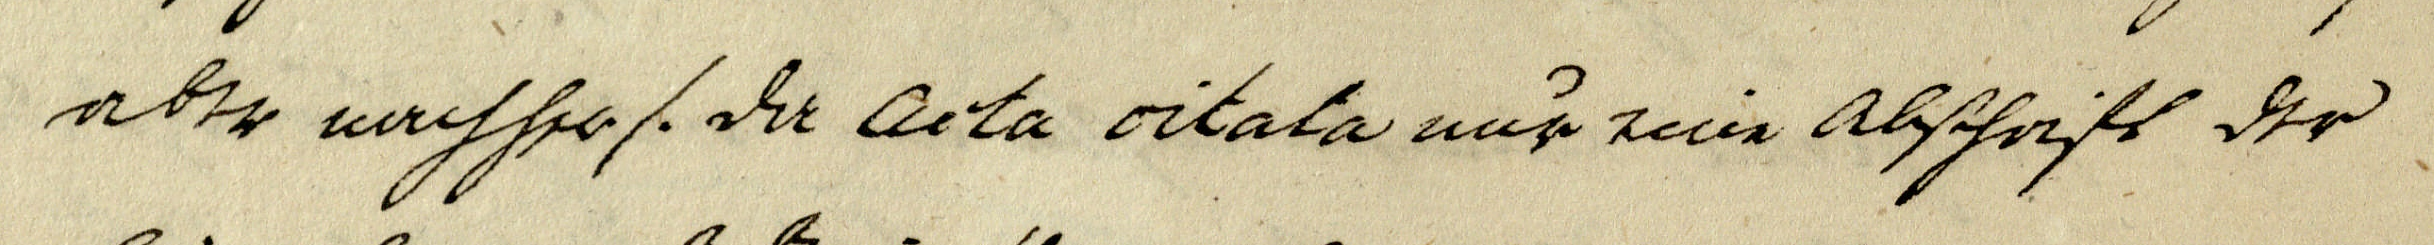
aber nachher /. da Acta citata nur eine Abschrift der
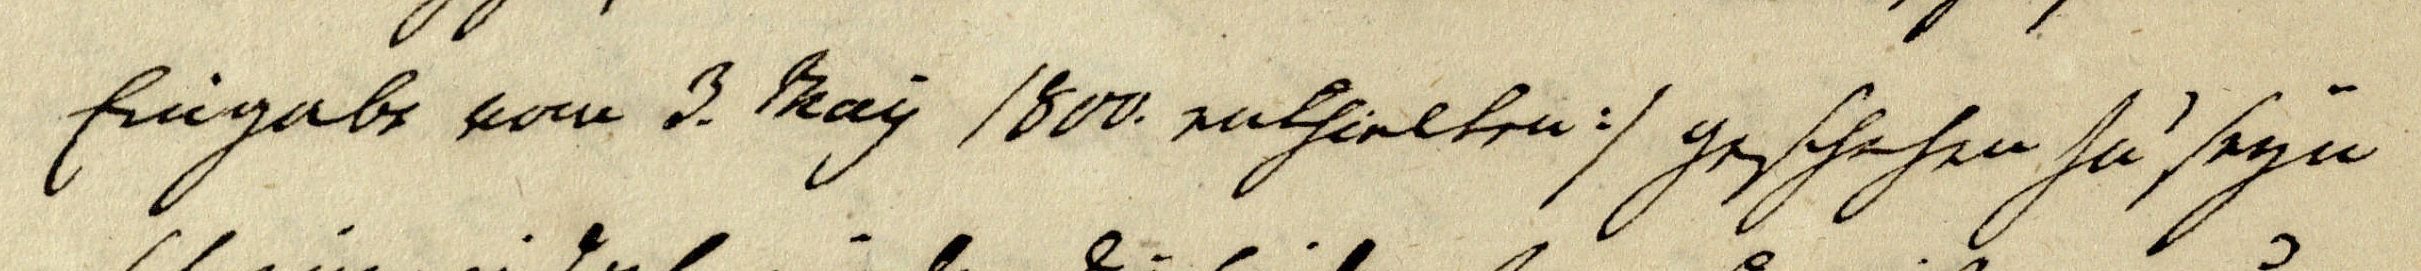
Eingabe vom 3. Maÿ 1800. enthielten :/ geschehen zu seÿn
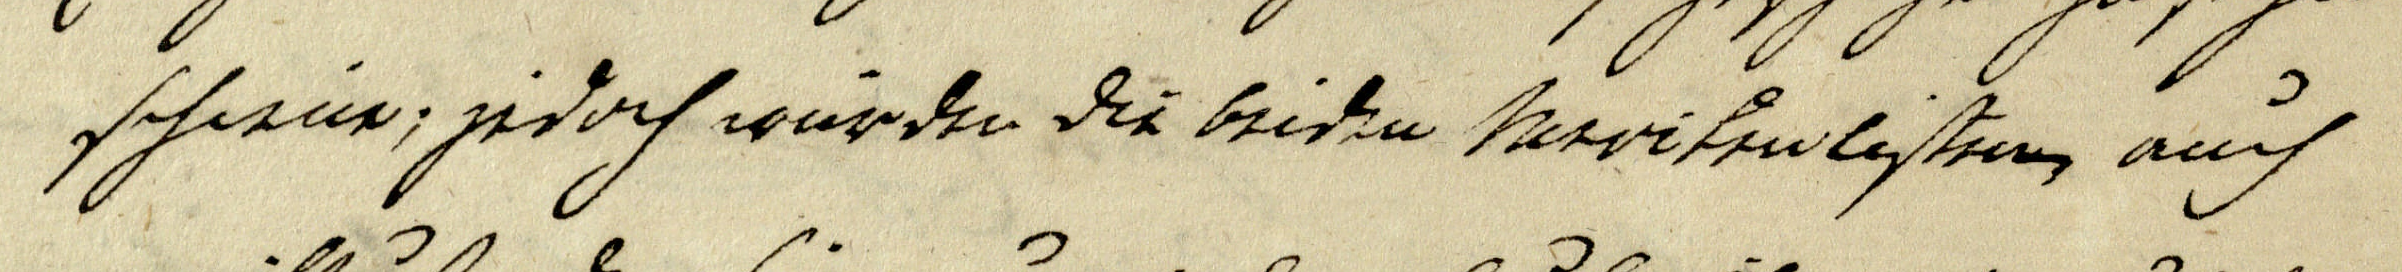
scheine, jedoch würden die beiden Meritenlisten, auch
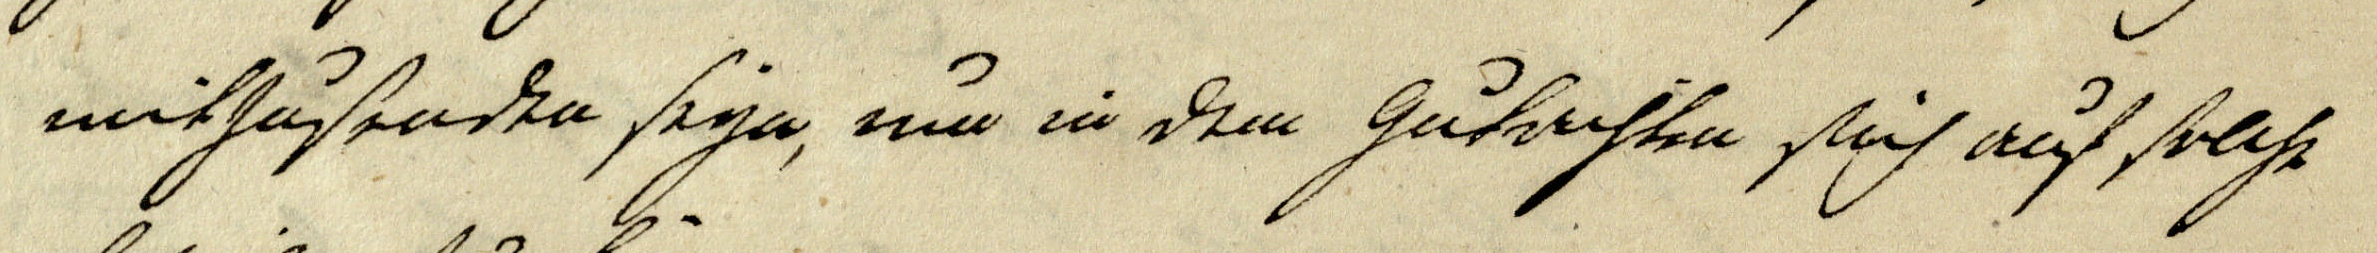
mitzusenden seÿn, um in dem Gutachten sich auf solche
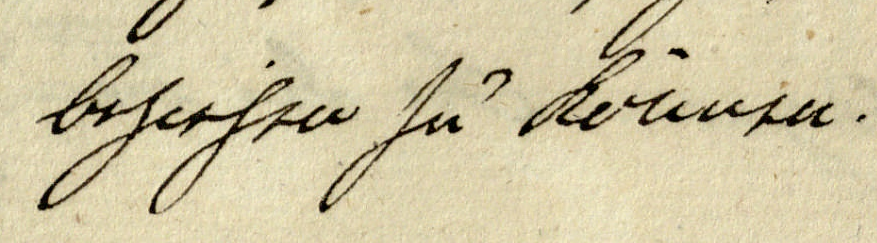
beziehen zu können.
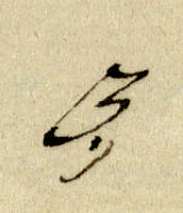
3.
